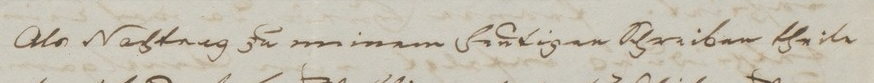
Als Nachtrag zu meinem heutigen Schreiben theile
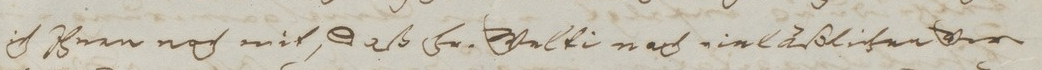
ich Ihnen noch mit, daß Hr. Welti nach einläßlichen Ver-
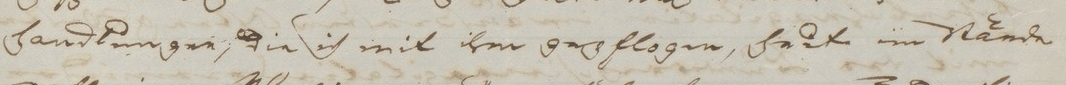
handlungen, die ich mit ihm gepflogen, heute im Stände-
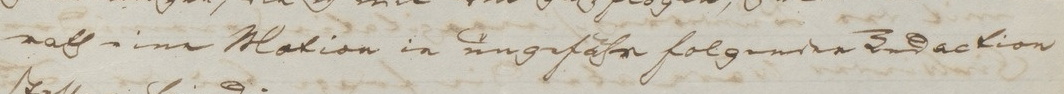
rath eine Motion in ungefähr folgender Redaction
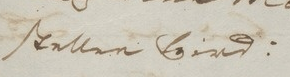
stellen wird:
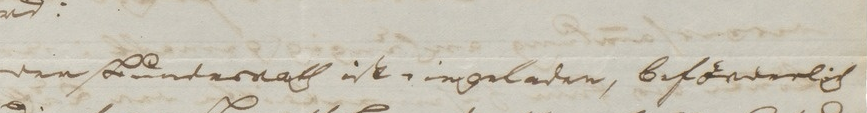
Der Bundesrath ist eingeladen, beförderlich
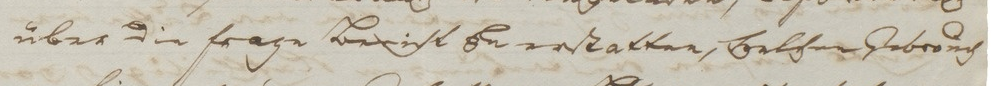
über die Frage Bericht zu erstatten, welchen Gebrauch
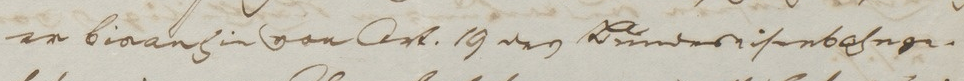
er bisanhin von Art. 19 des Bundeseisenbahnge-
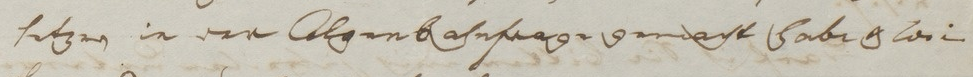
setzes in der Alpenbahnfrage gemacht habe & wei-
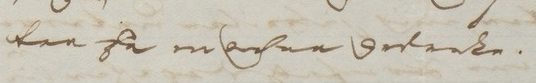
ter zu machen gedenke.
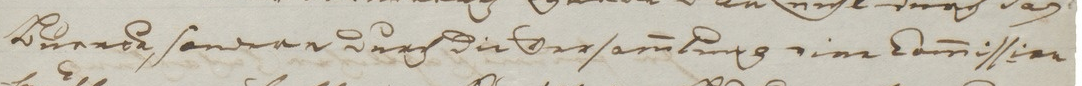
Bureau, sondern durch die Versammlung eine Commission
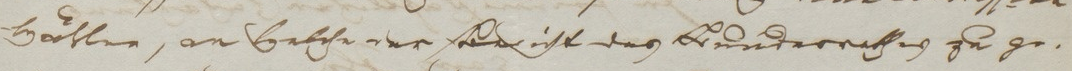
wählen, an welche der Bericht des Bundesrathes zu ge-
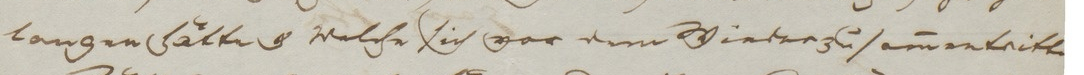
langen hätte & welche sich vor dem Winterzusammentritte
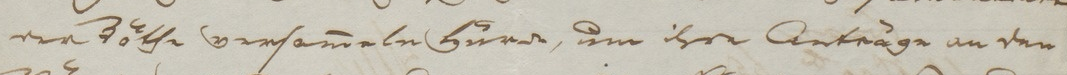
der Räthe versammeln würde, um ihre Anträge an den
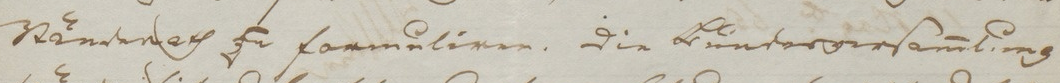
Ständerath zu formuliren. Die Bundesversammlung
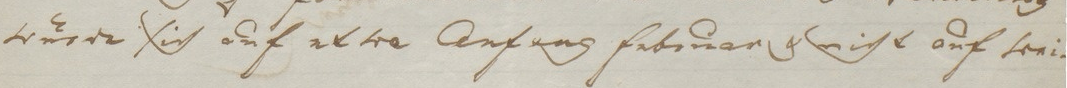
würde sich auf etwa Anfang Februar & nicht auf wei-
